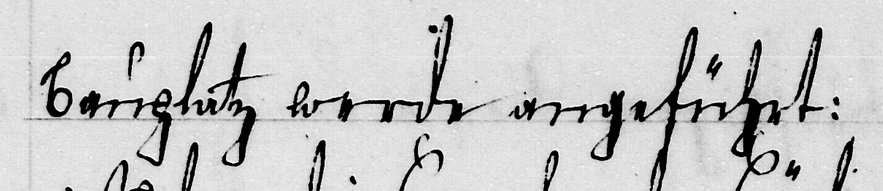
Bauplatz werde angeführt:
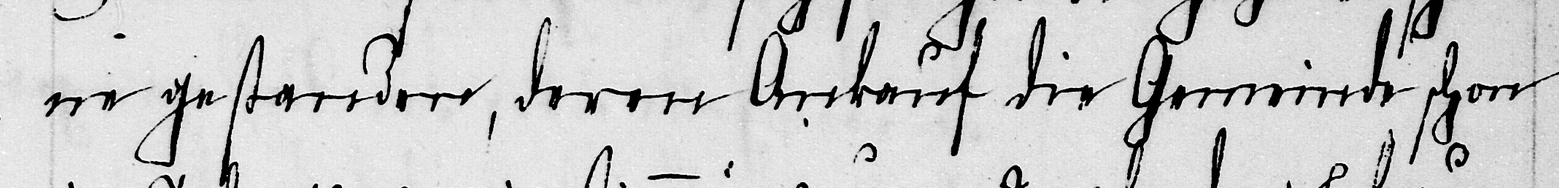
ne gestanden, deren Ankauf die Gemeinde schon
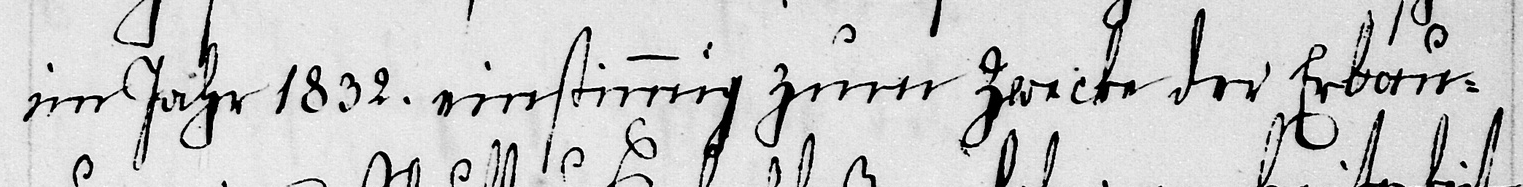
im Jahr 1832. einstimmig zum Zwecke der Erbau¬
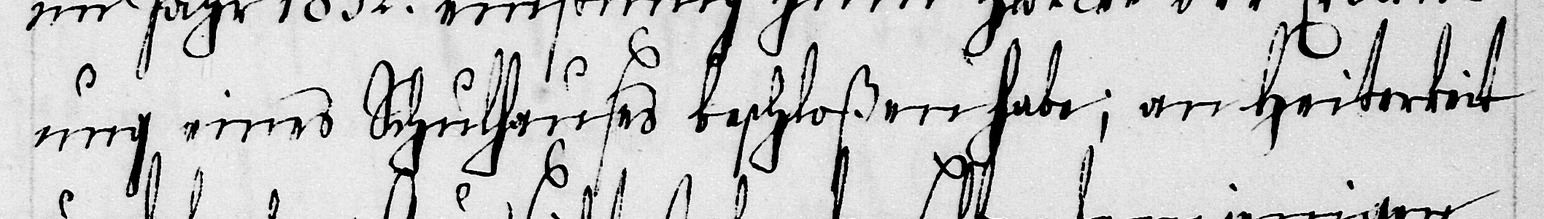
ung eines Schulhauses beschloßen habe; an Heiterkeit
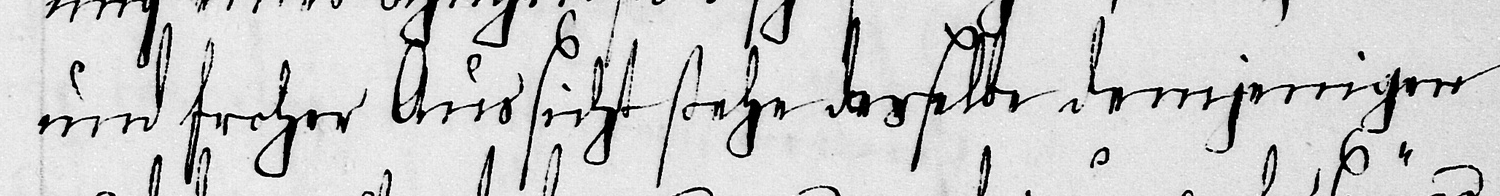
und froher Aussicht stehe dasselbe demjenigen
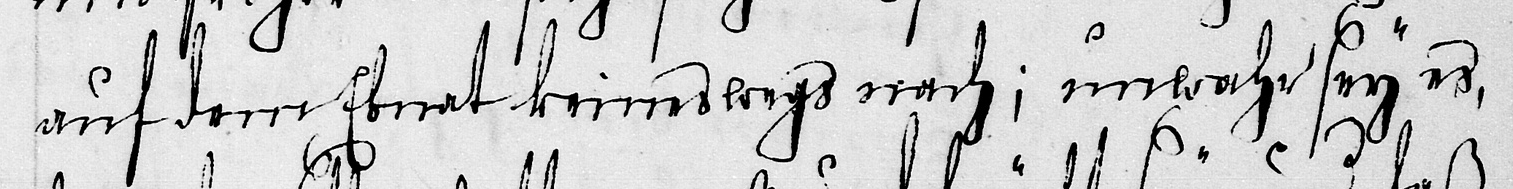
auf dem Ebnat keineswegs nach; unwahr sey es,
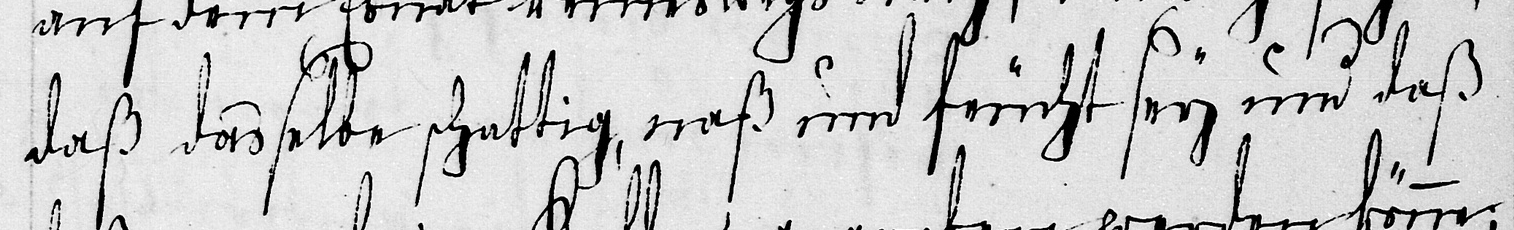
daß dasselbe schattig, naß und feucht sey und daß
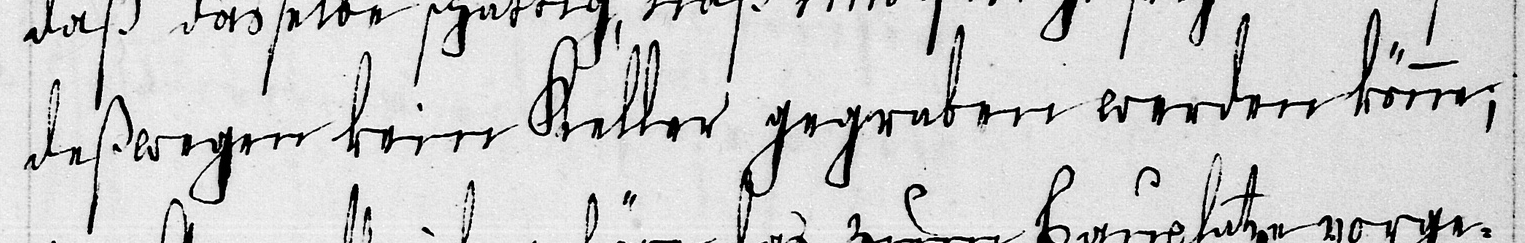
deßwegen kein Keller gegraben werden könne;
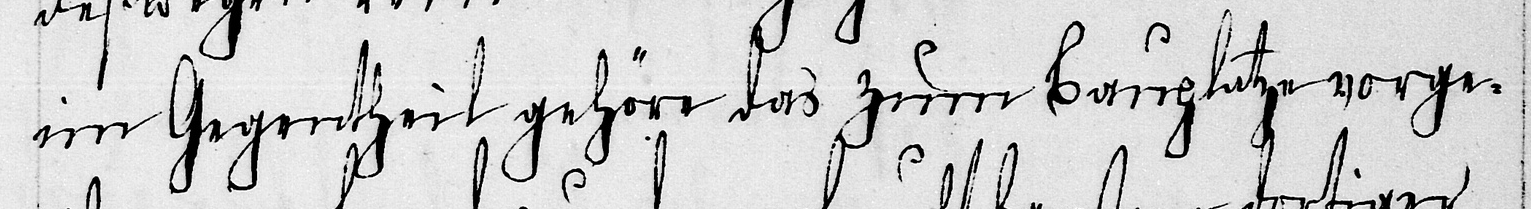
im Gegentheil gehöre das zum Bauplatze vorge¬
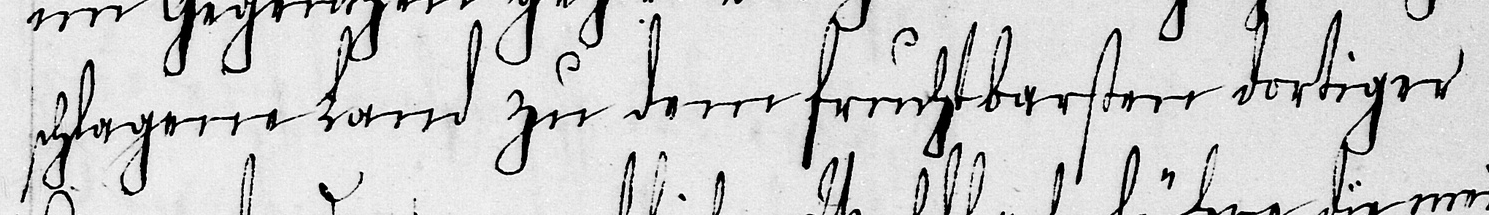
schlagene Land zu dem fruchtbarsten dortiger
